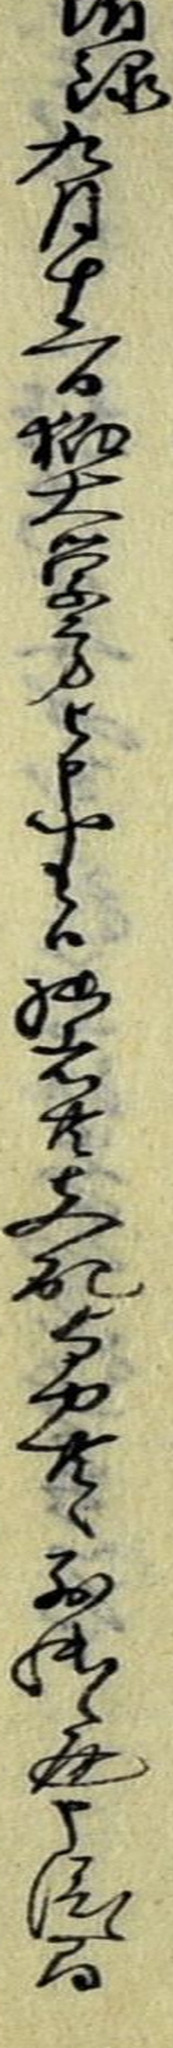附録九月十二日狛大学方被申聞候ハ拙者共支配与力共へ別紙之通申渡候間
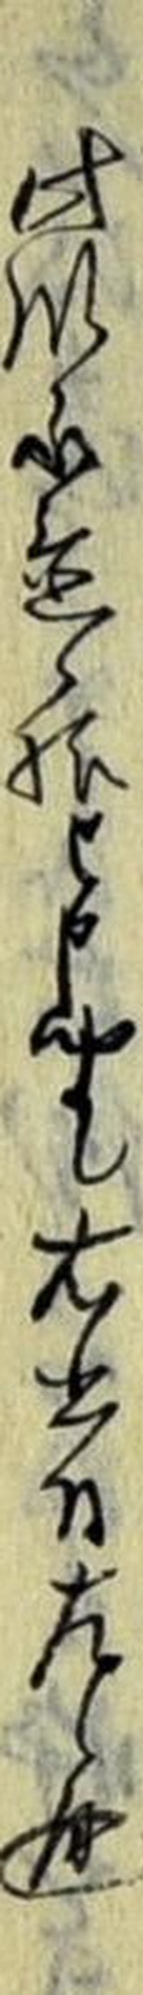此段承置候様被申聞候右書付左之通
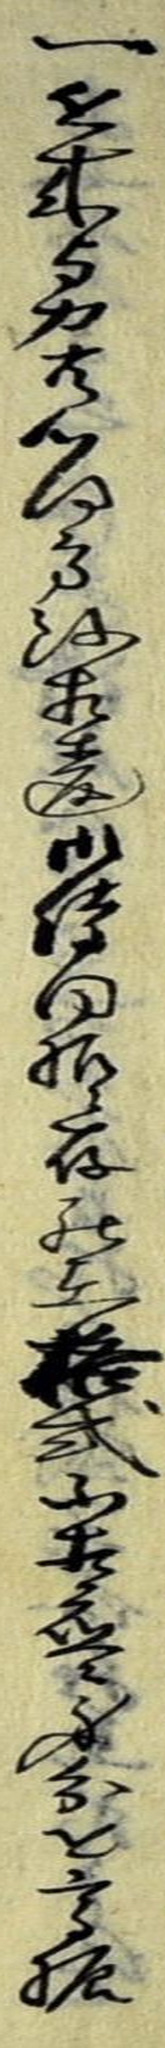一近来与力共心得方致相違御侍同様ニ存罷在格式不相応ニ身分を高振

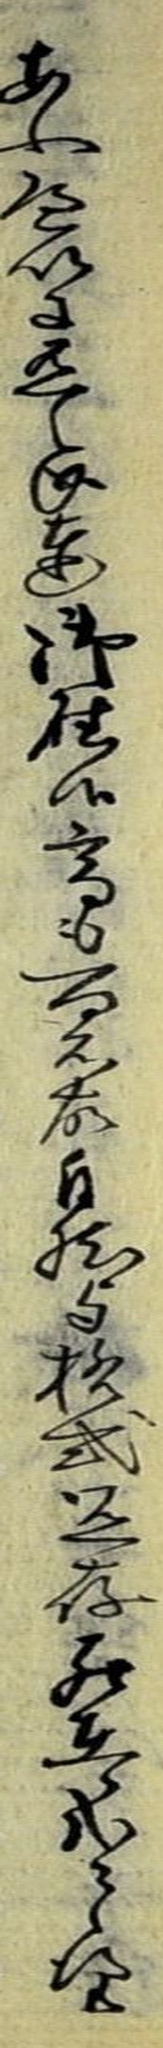あふへいに有之趣達御聴候高も百石故自然与格式宜存罷在候哉ニ候得共
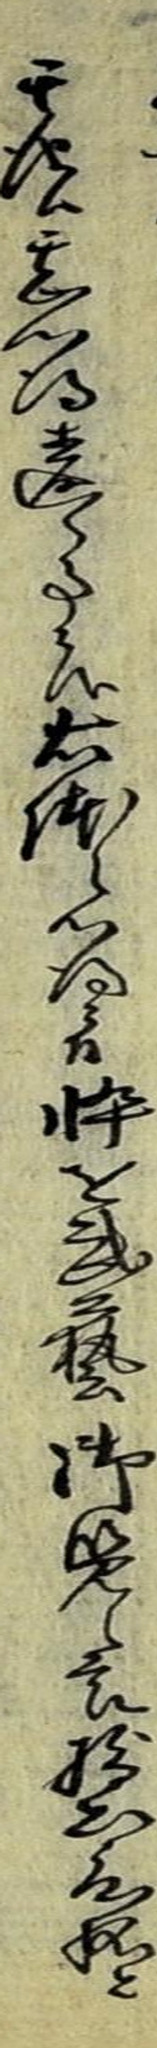其儀ハ甚心得違之事ニ候右体之心得ニ付忰を武芸御覧之節指出度抔と
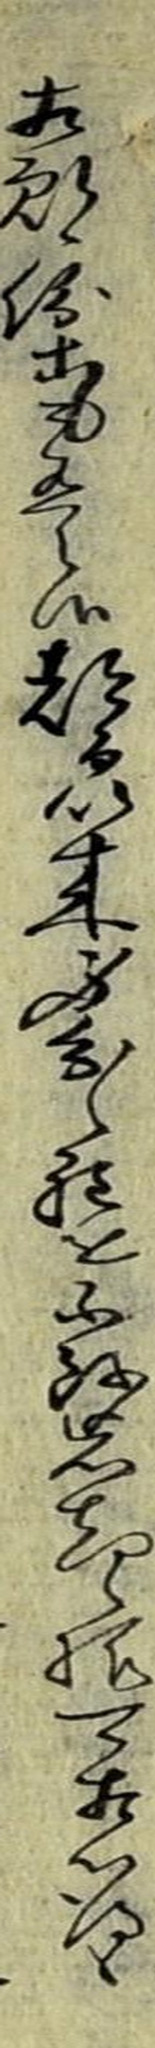相願候儀等も有之候都而以来身分之程を不致忘却候様可相心得候
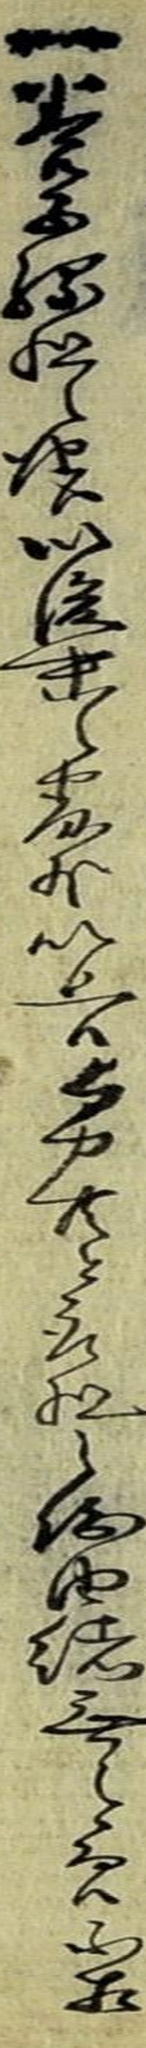一養子縁組之儀ハ以後末之番外以上ハ与力共と取組之儀由緒無之候而ハ不相
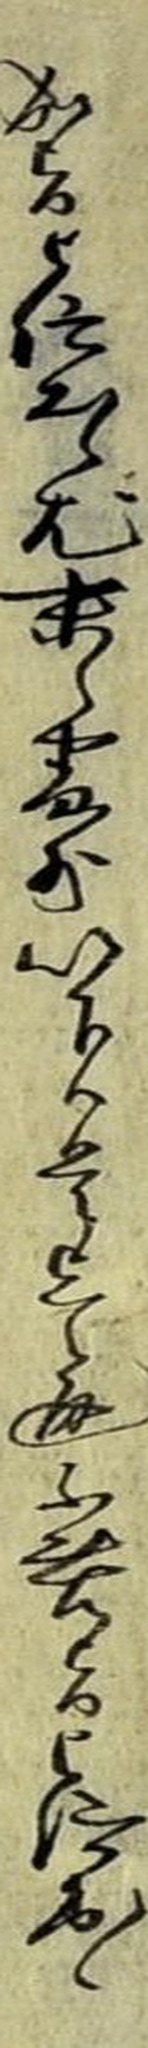成旨被仰出候尤末之番外以下ハ是迄之通不苦旨被仰出候
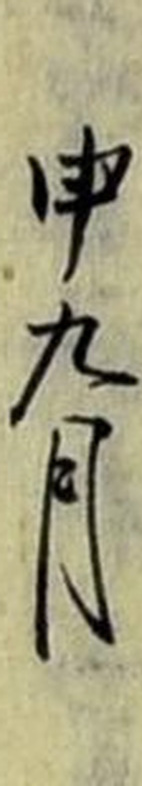申九月
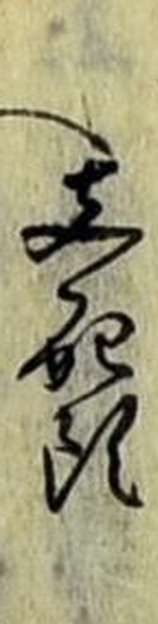支配頭
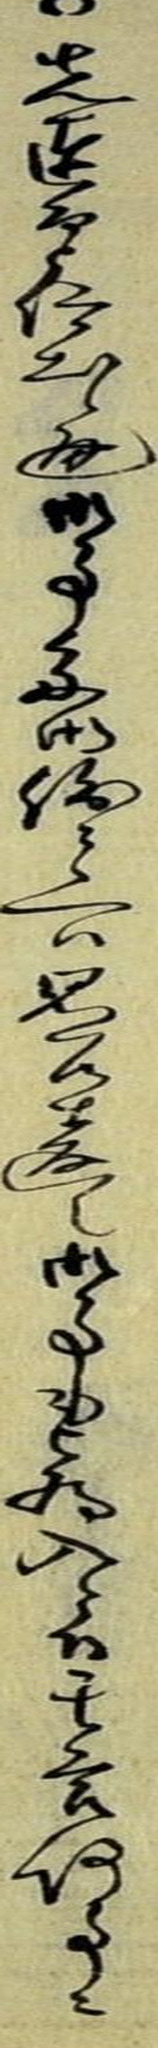〇先達而被仰出候通御事多御儀ニ候ヘハ思召違候御事も被為入候ニ付其節何事ニ
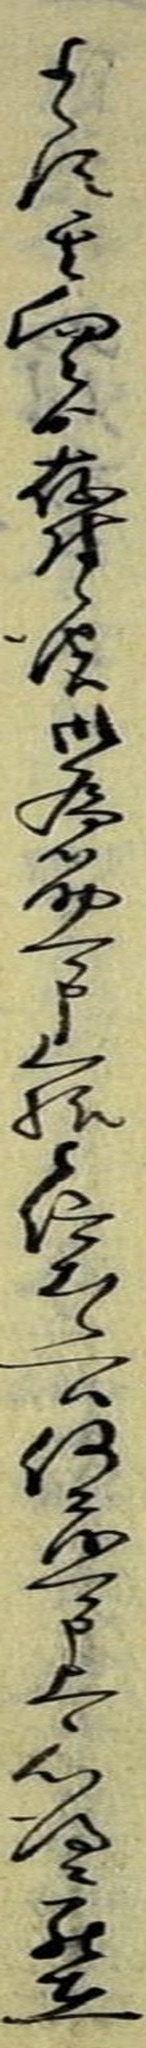よらす其向々ゟ存付候儀ハ御為筋可申上様被仰出候ヘハ何茂可申上候心得ニ罷在
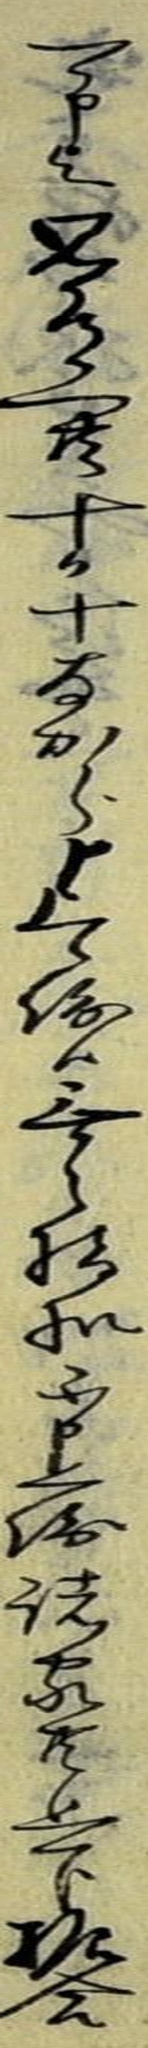可申与思召候へ共十か十なから申上候儀ハ無之指控不申上儀諸家共上下振合
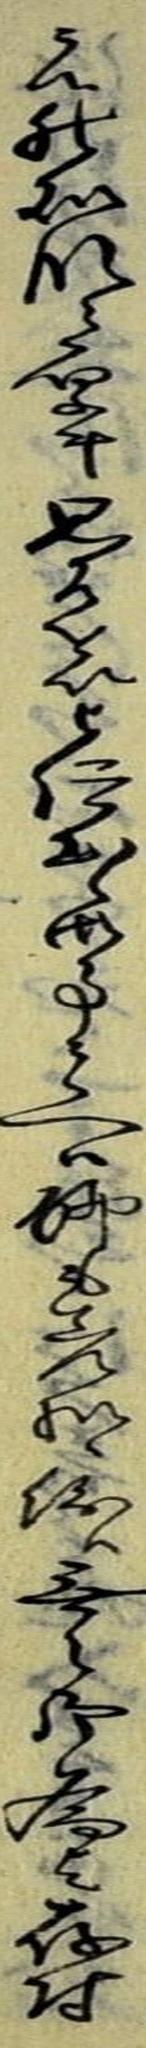ニ候然処段々厚キ思召を以被仰出候御事ニ候ヘハ聊も差控候儀ハ無之御為与存付
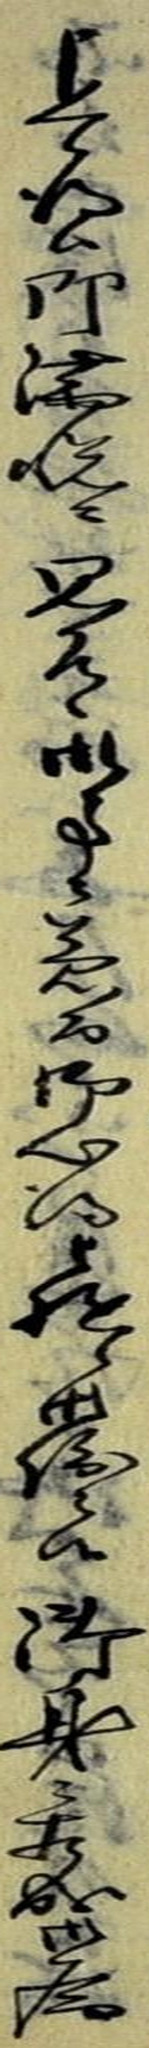申上候得ハ御満悦ニ思召候御事ニ兼而御心得被遊候御儀ニ候御身ニ相成御為
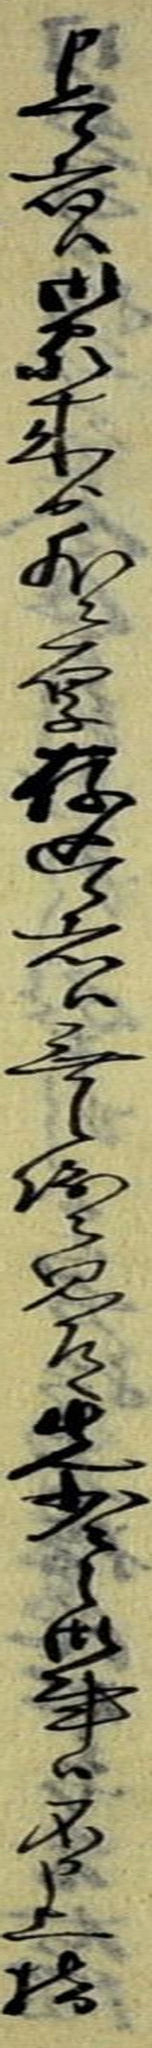申上候者ハ御家来ゟ外ニ厚存込候者ハ無之儀ニ思召候先少々之御事ハ不申上指
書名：命令之部 三
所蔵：福井県文書館 Fukui Prefectural Archives
